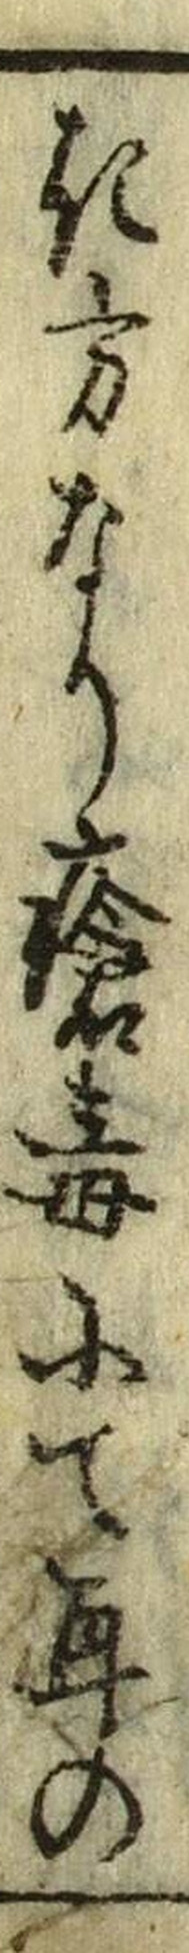き方なり瘡毒にて耳の

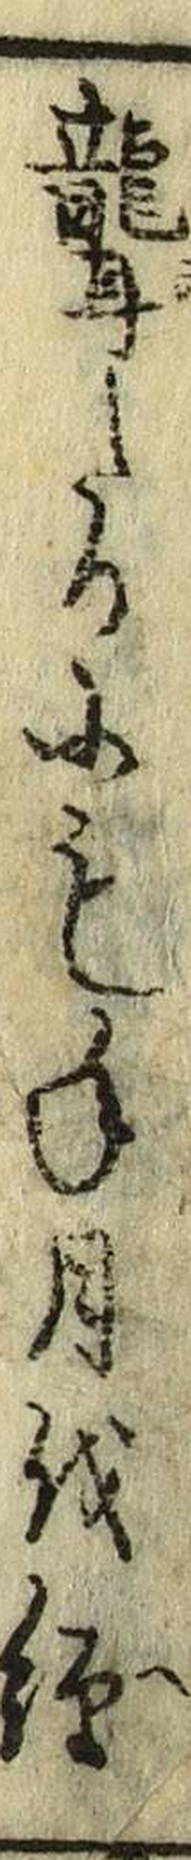聾たるにも年月を経
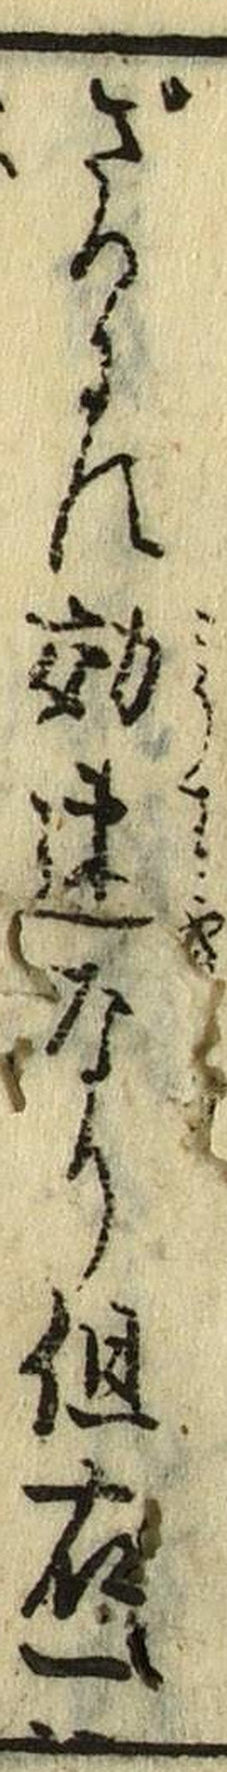ざるには効速なり但右一
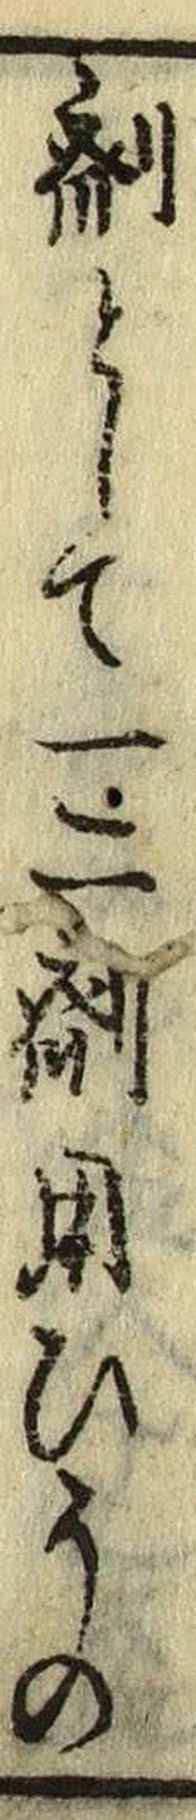剤として一・二剤用ひその
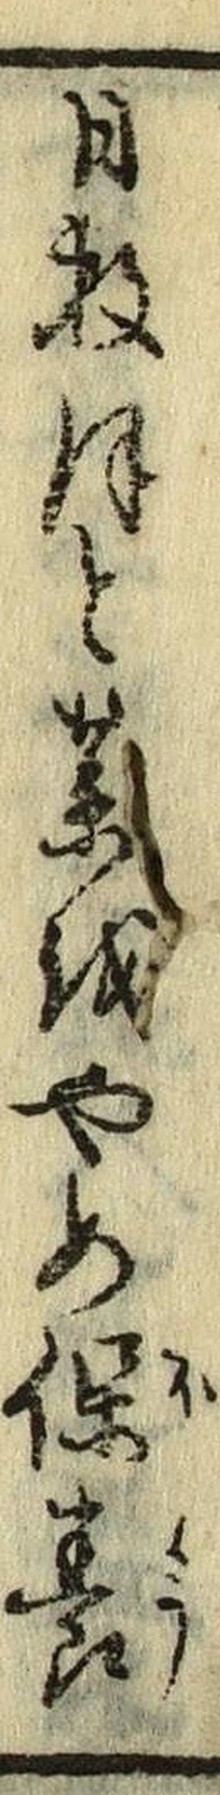日数月と薬をやめ保養
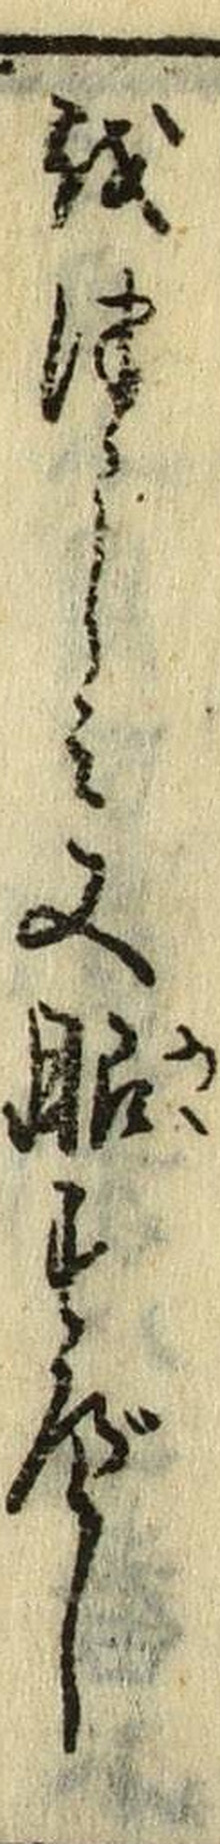をつゝしみ又服すべし
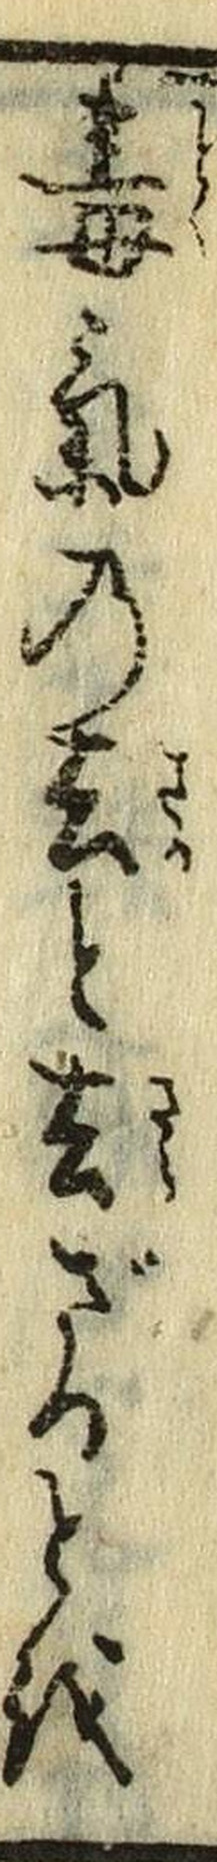毒気の去と去ざるとを
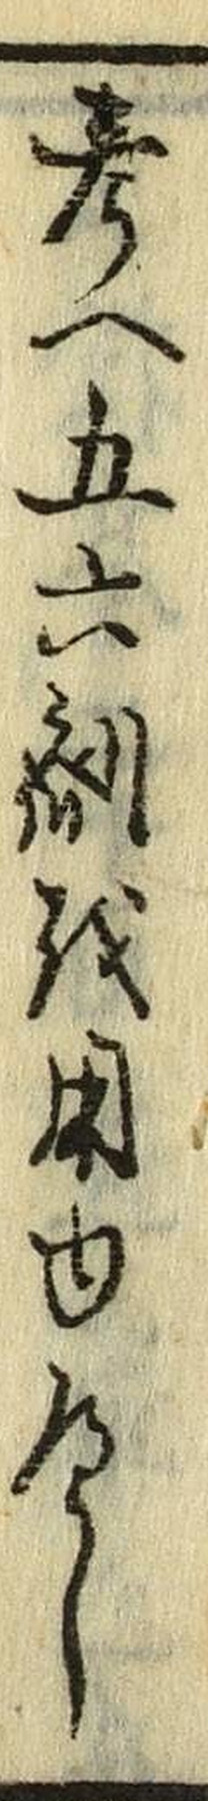考へ五六剤を用ゆへし
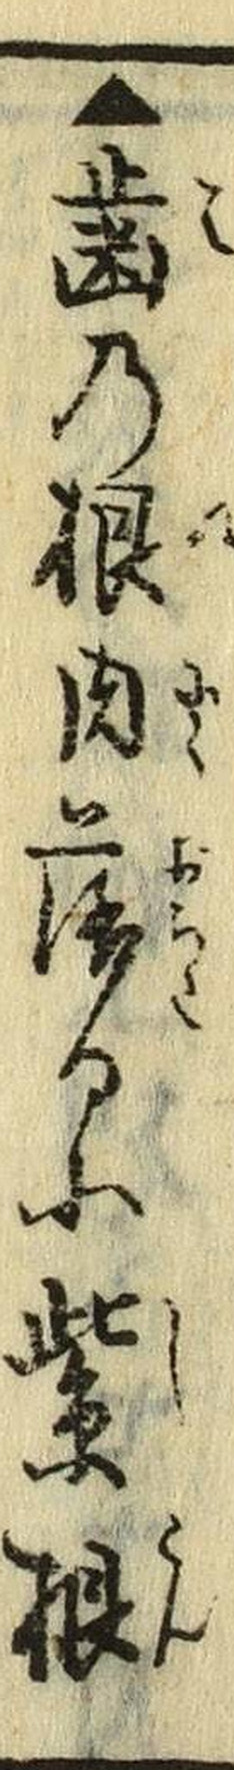▲歯の根肉落るに紫根
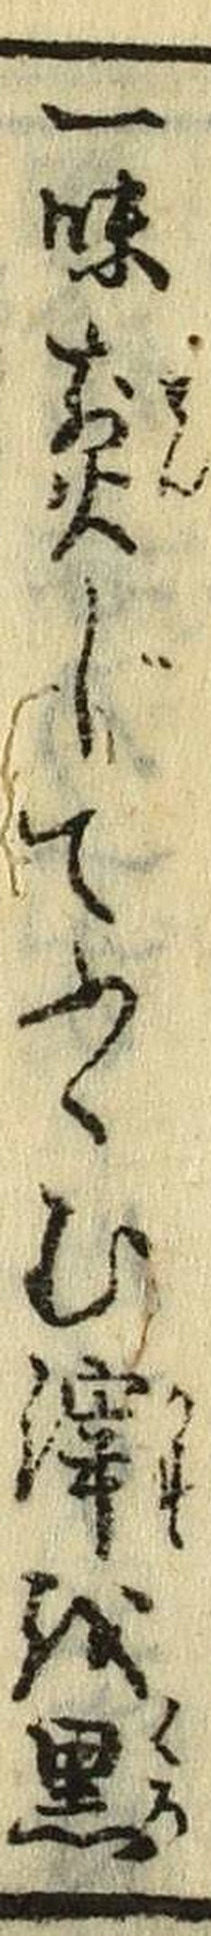一味煎じてふくむ滓を黒
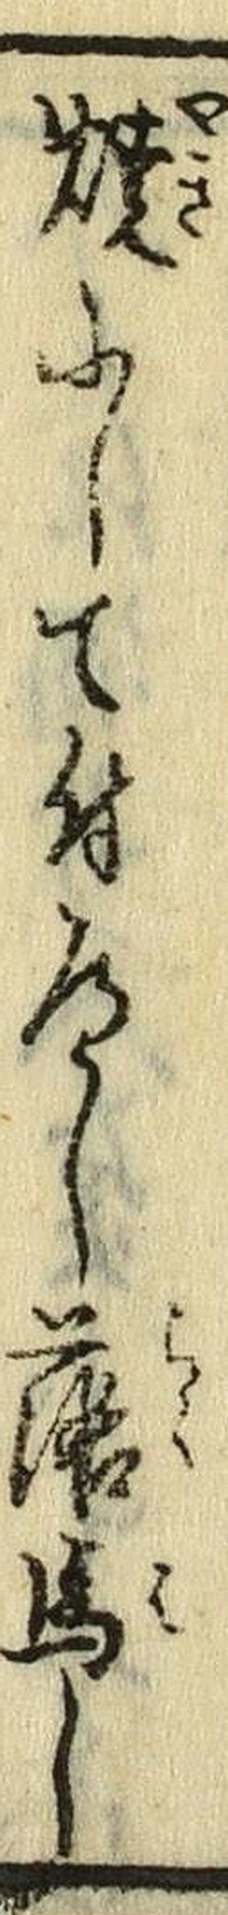焼にして付へし落馬し
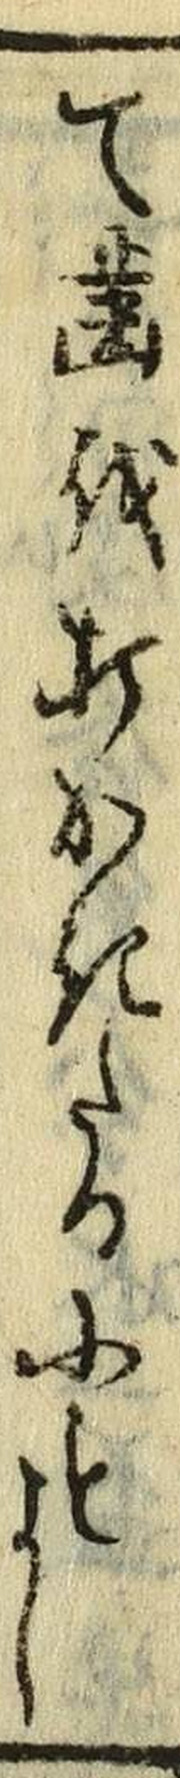て歯を打かきたるにもよし
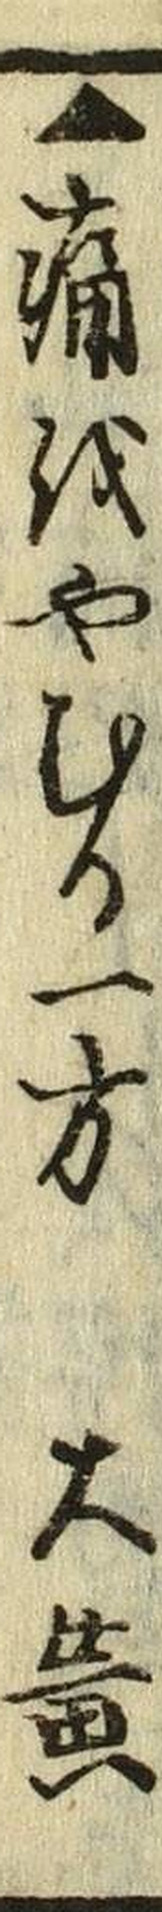▲痛をやむる一方大黄
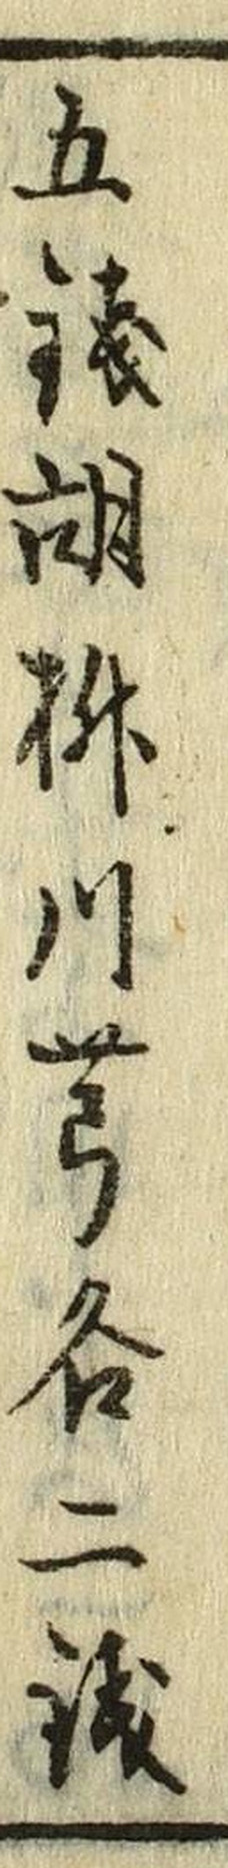五銭胡椒川芎各二銭
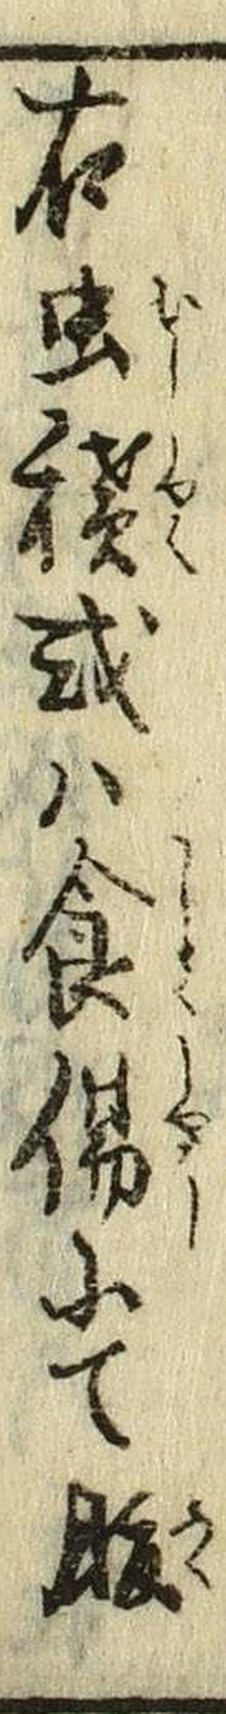右虫積或は食傷にて腹
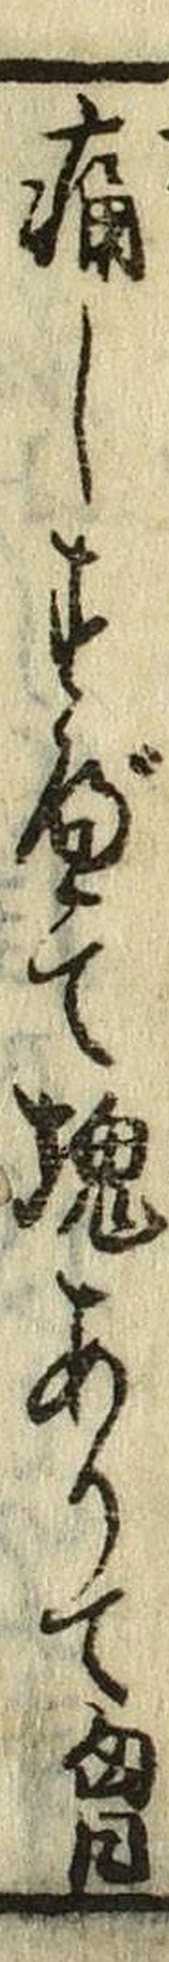痛しすべて塊ありて胸
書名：居家養生記
